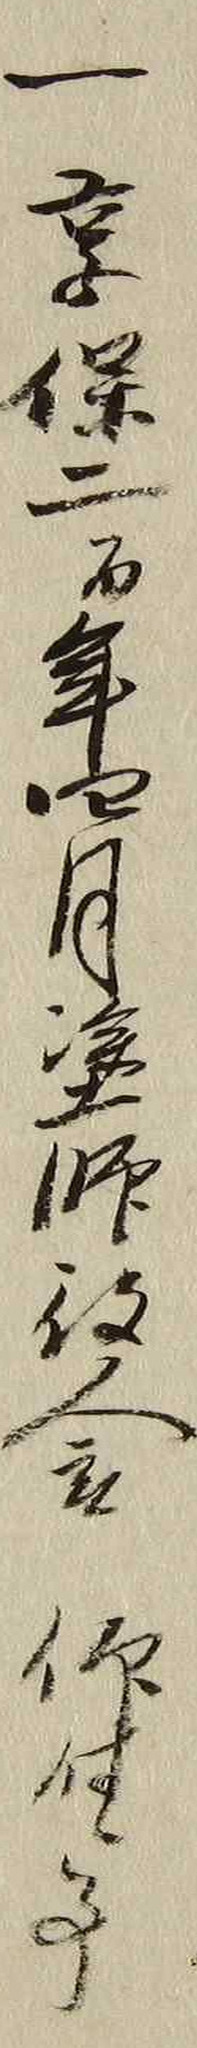一享保二酉年四月塗師役人被仰付候事
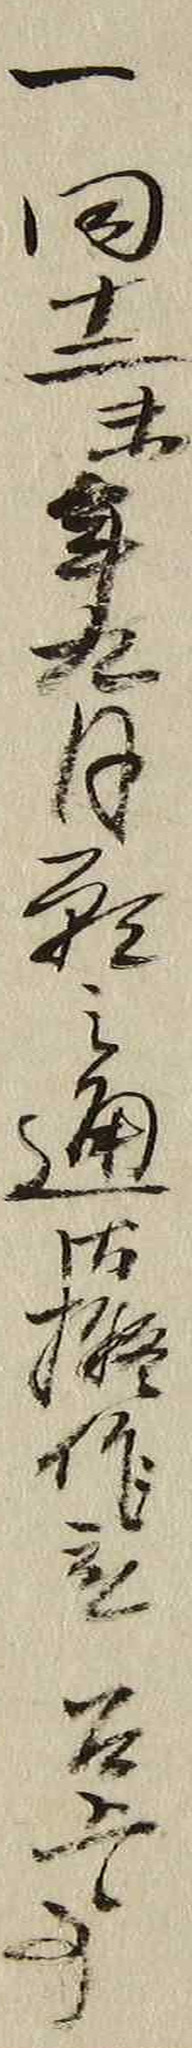一同十二未年九月願之通御擬作被召上候事
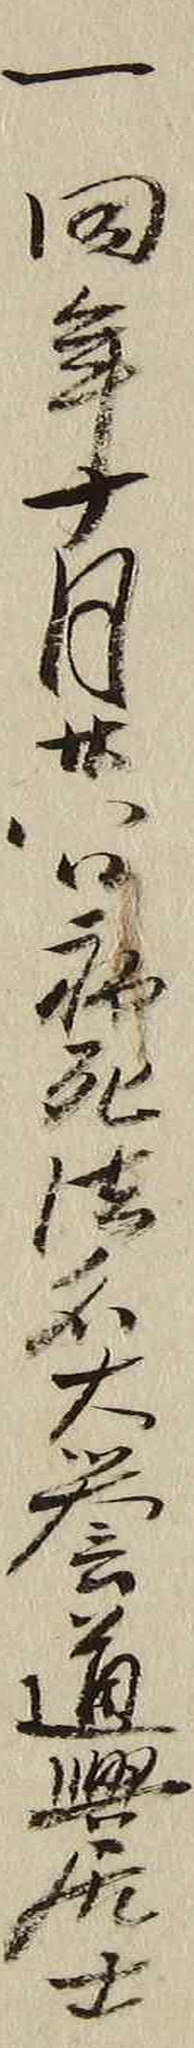一同年十月廿八日病死法名大誉道興居士
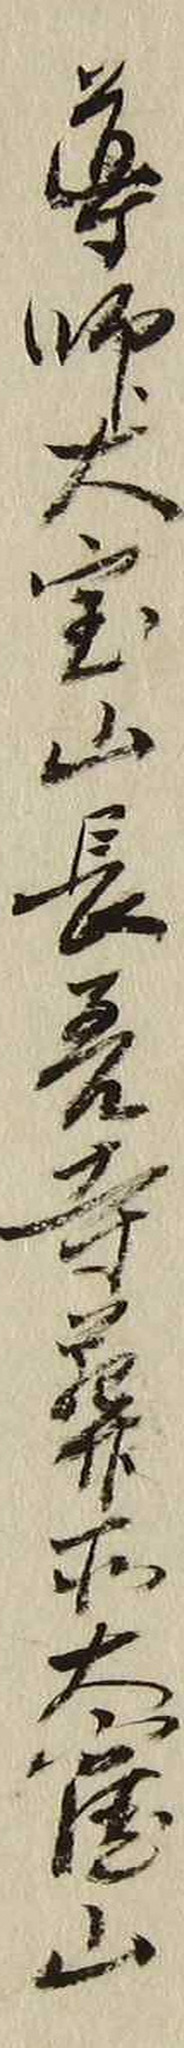導師大宝山長善寺葬所大窪山
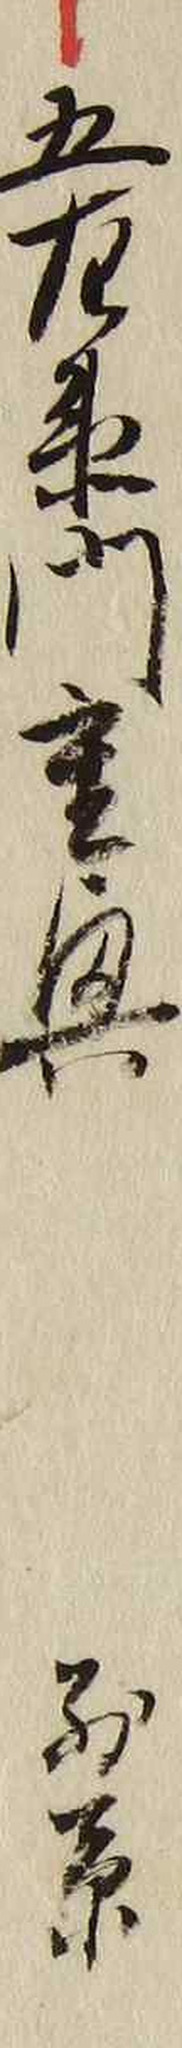五左衛門重興別系
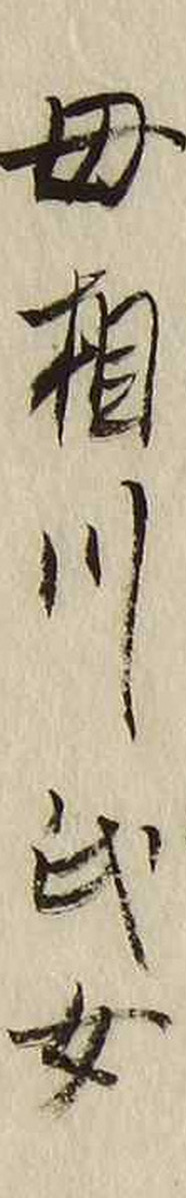母相川氏女

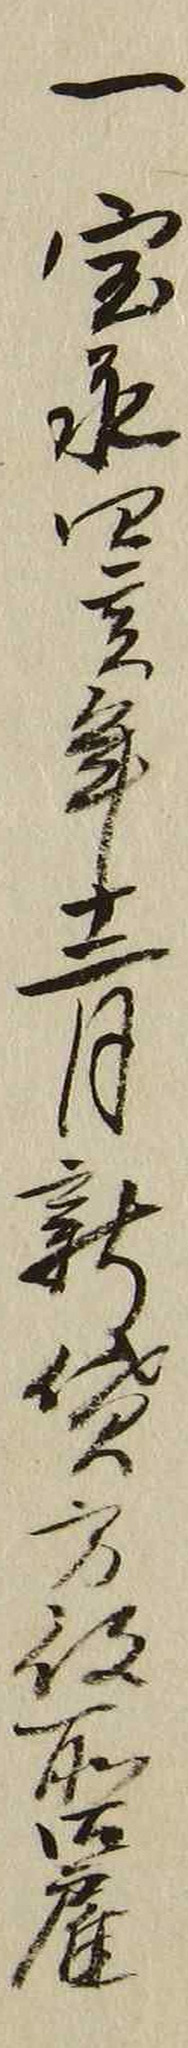一宝永四亥年十二月新貸方役所御雇
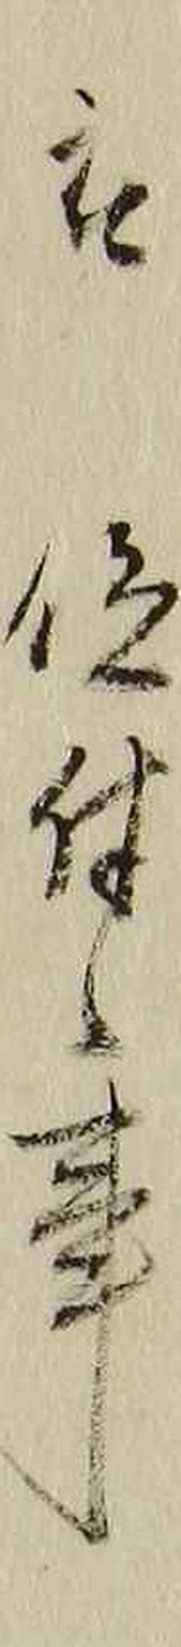被仰付候事
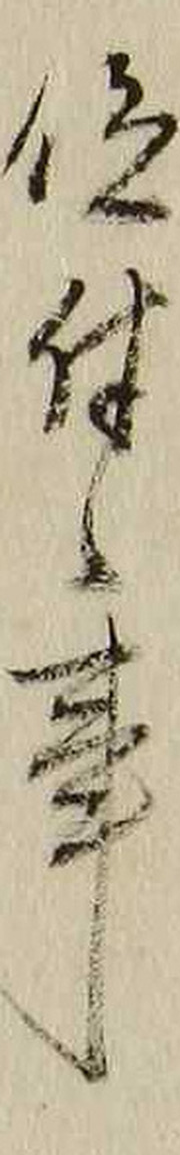仰付候事
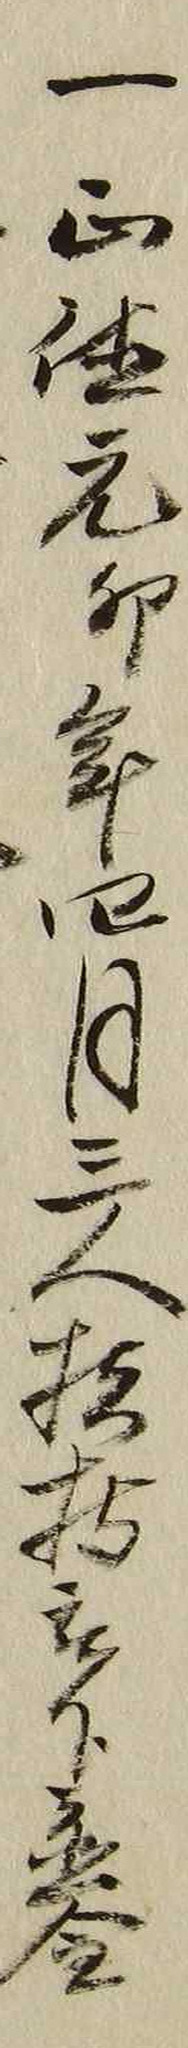一正徳元卯年四月三人扶持被下置金
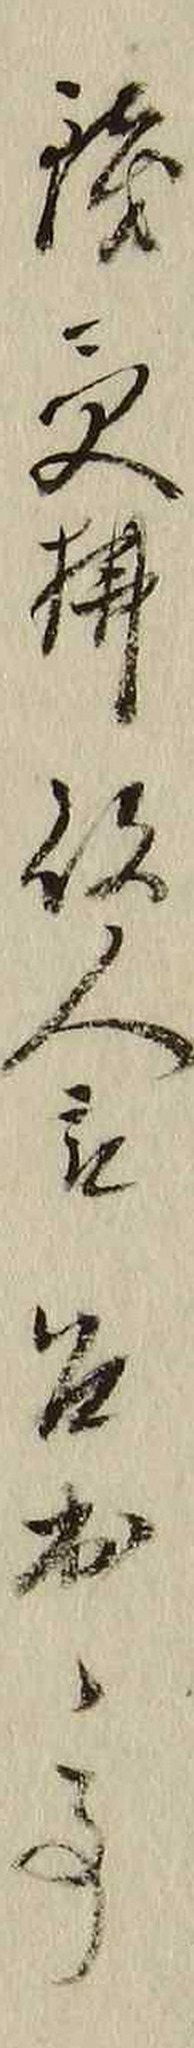銭受払役人被召出候事
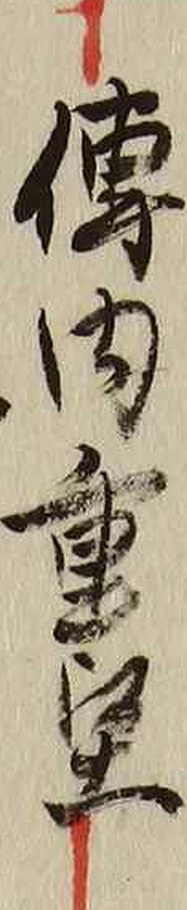伝内重堅
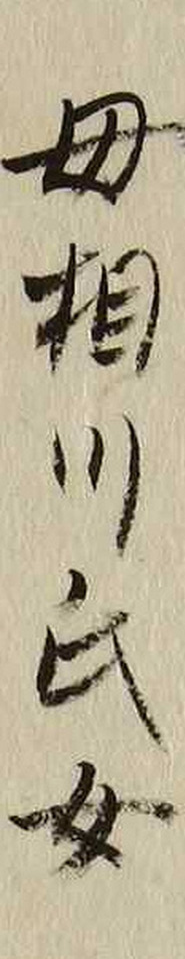母相川氏女
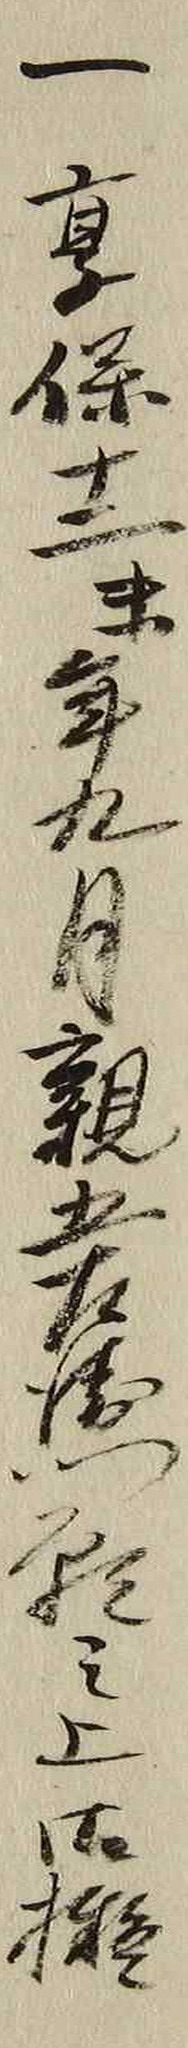一享保十二未年九月親五左衛門願之上御擬
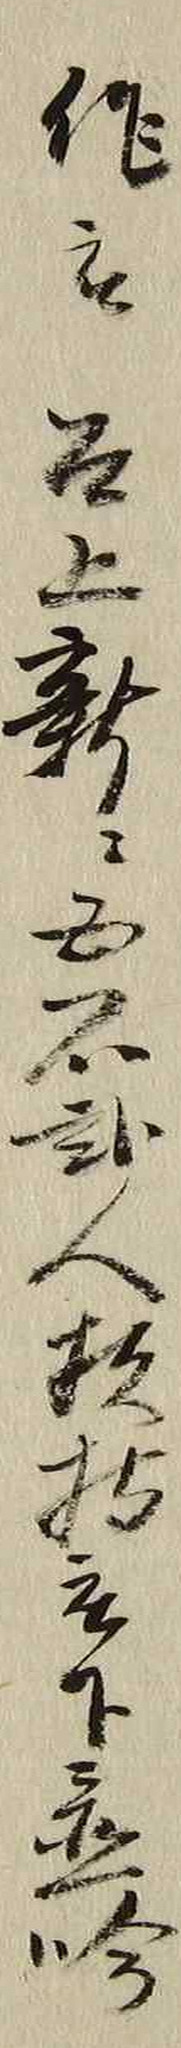作被召上新五石弐人扶持被下置吟
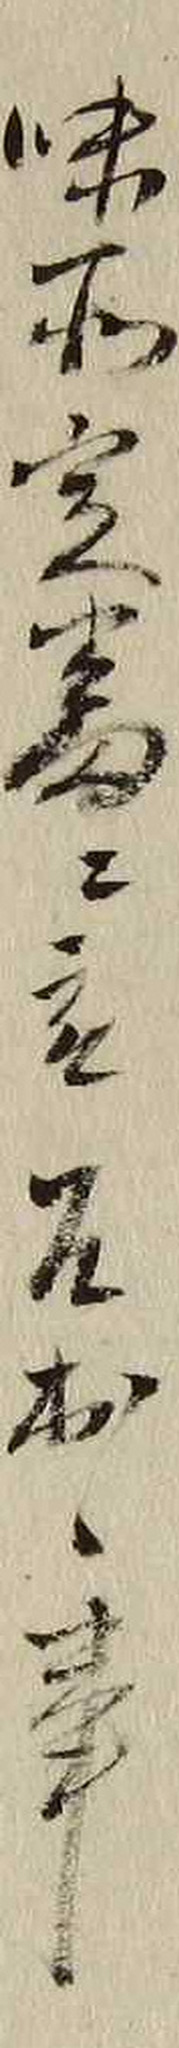味所定番被召出候事
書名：諸士系譜　巻之350　せ之部1冊全
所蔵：会津若松市立会津図書館
